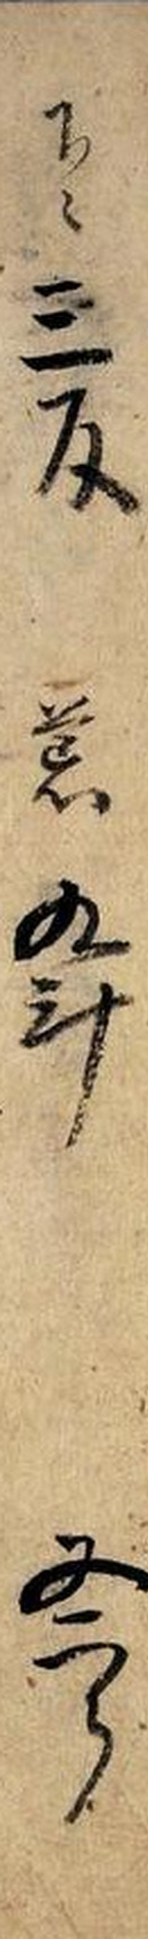下々三反荒九斗又二郎
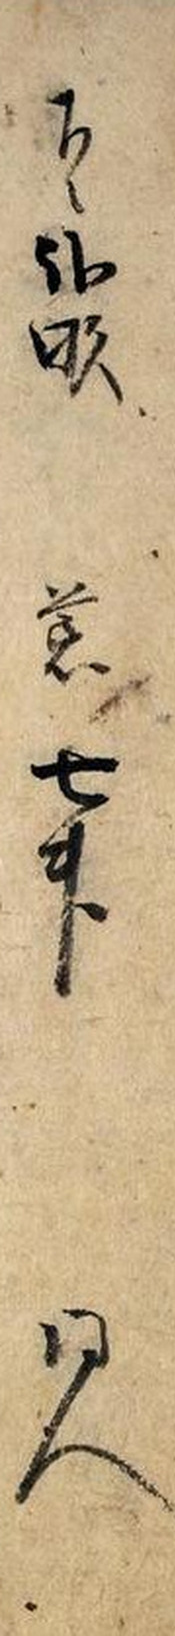下々弐畝荒七升同人
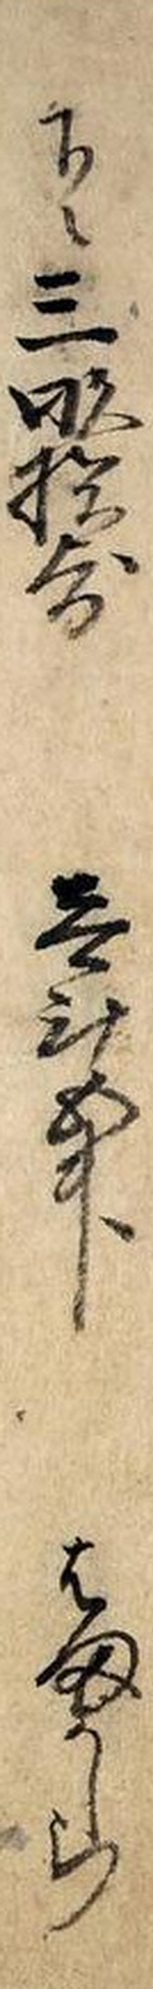下々三畝拾歩壱斗五升はまかしら
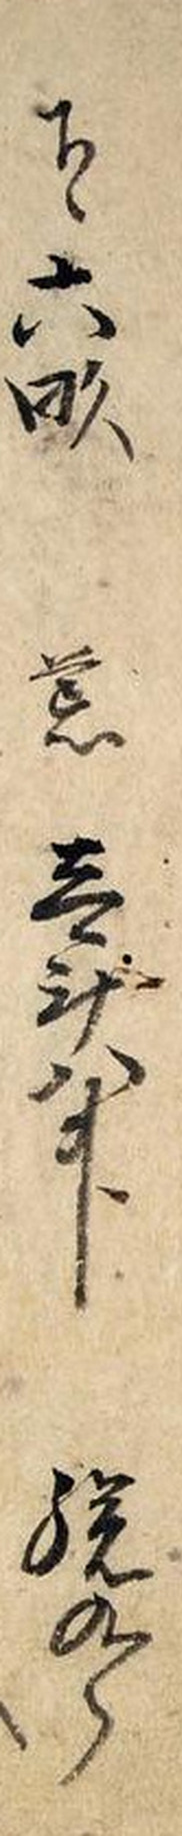下々六畝荒壱斗八升孫九郎
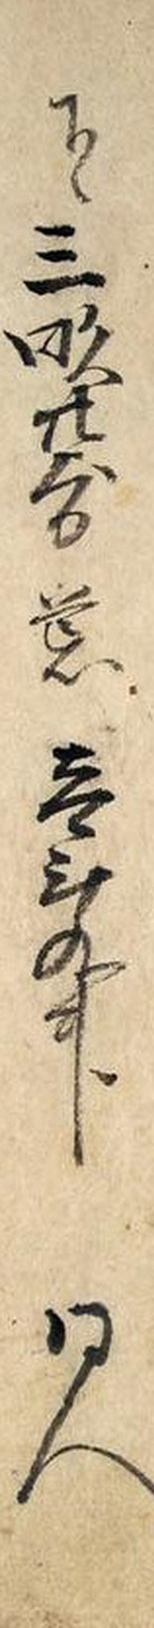下々三畝廿歩荒壱斗九升同人
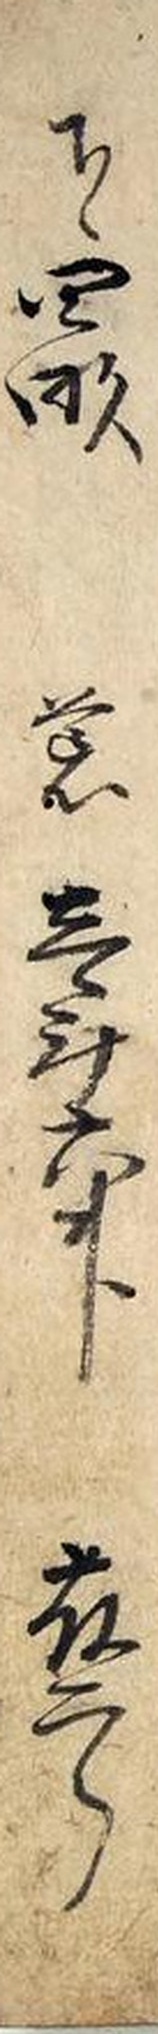下々四畝荒壱斗六升藤二郎

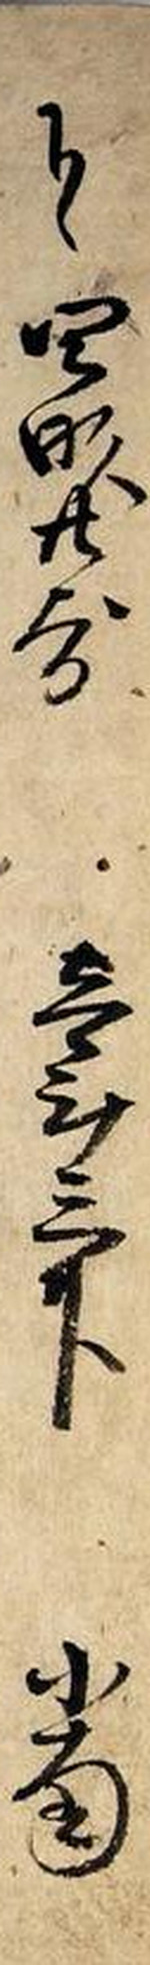下々四畝廿歩壱斗三升小南
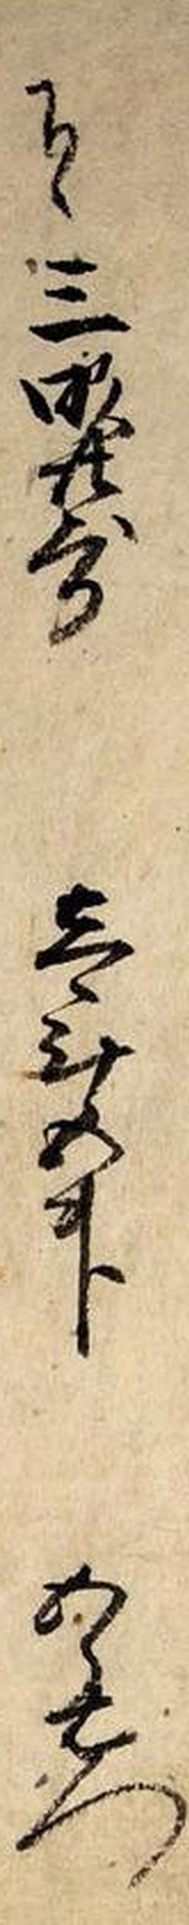下々三畝廿歩壱斗五升五郎右衛門
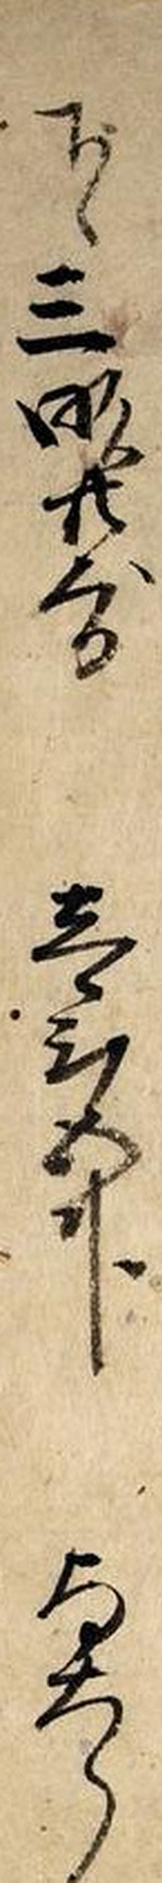下々三畝廿歩壱斗五升与大郎
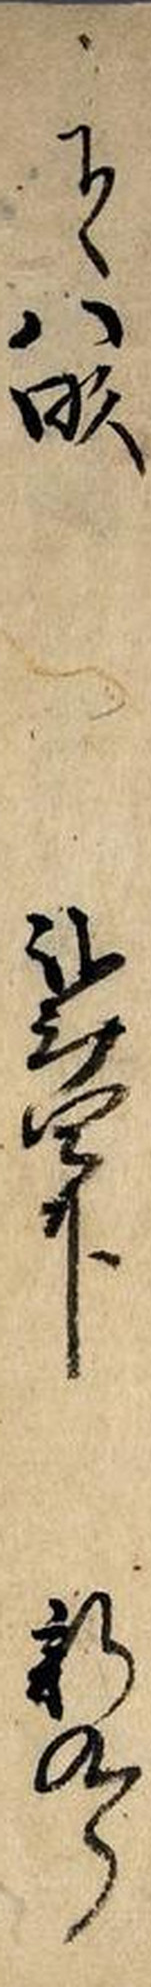下々八畝弐斗四升新九郎
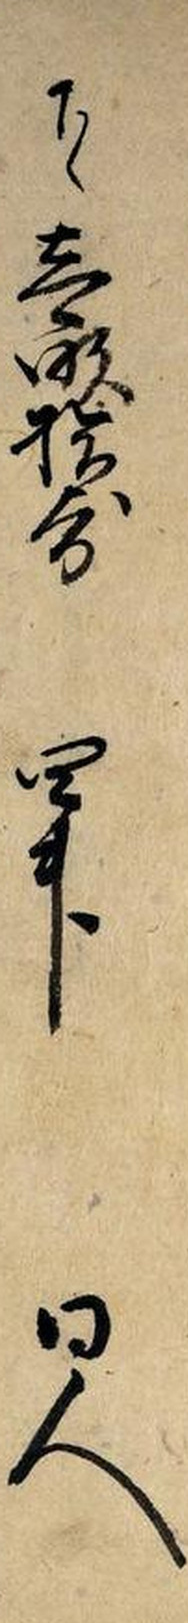下々壱畝拾歩四升同人
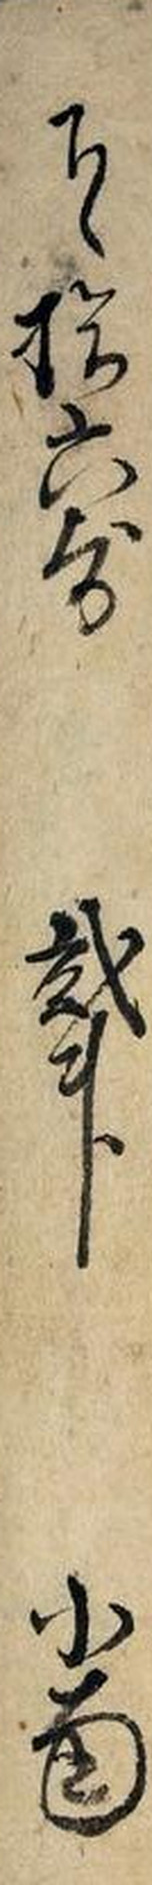下々拾六歩弐升小南
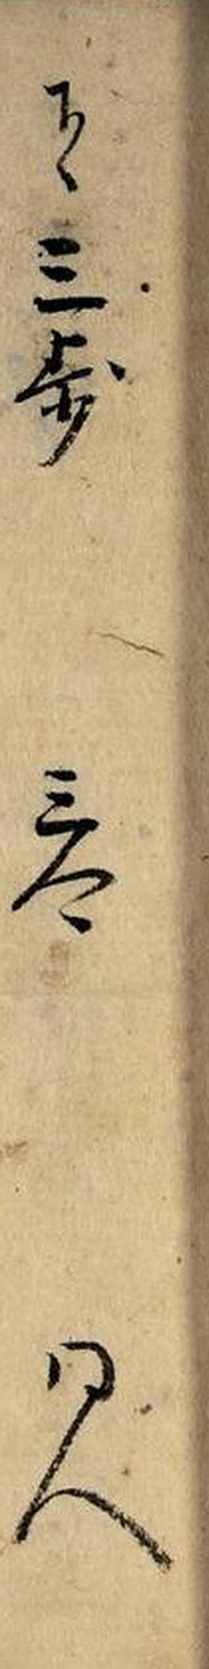下々三歩三合同人
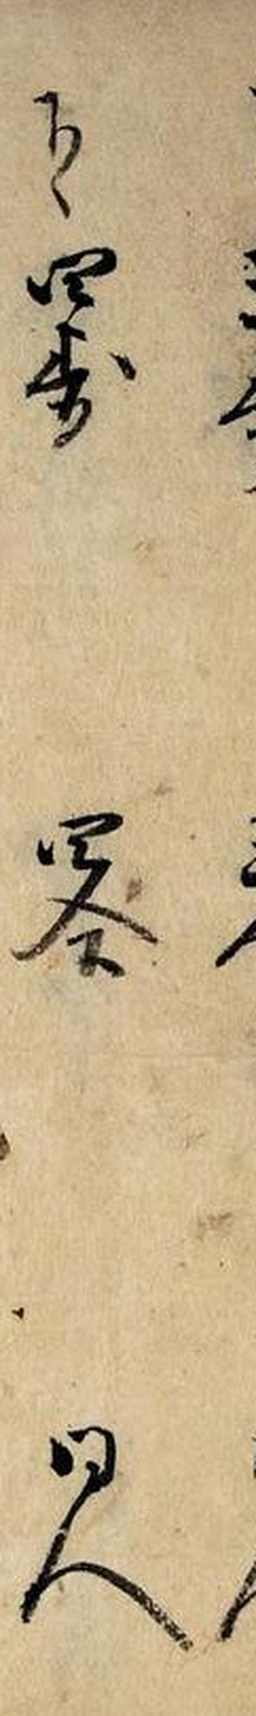下々四歩四合同人
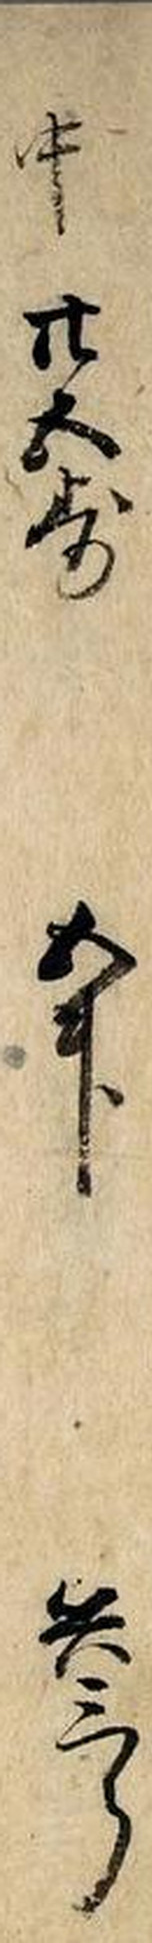中廿五歩五升兵三郎
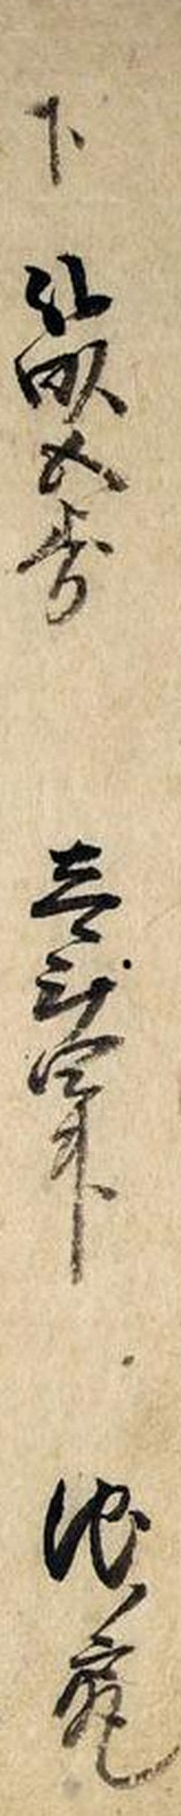下弐畝五歩壱斗四升池ノ尻
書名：若州三方郡之内世久見浦御検地帳（世久見浦検地帳写）
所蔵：福井県文書館 Fukui Prefectural Archives
